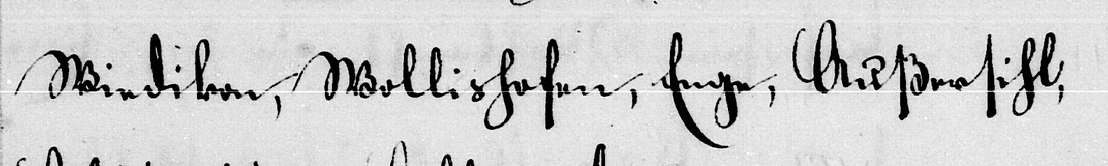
Wiedikon, Wollishofen, Enge, Außersihl,
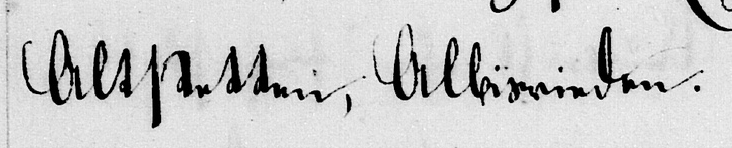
Altstetten, Albisrieden.
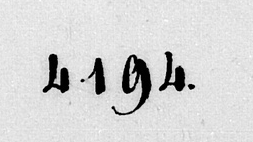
4194.
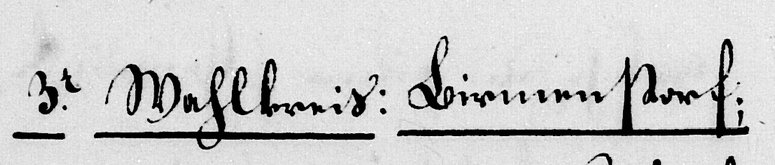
3.r Wahlkreis: Birmensdorf;
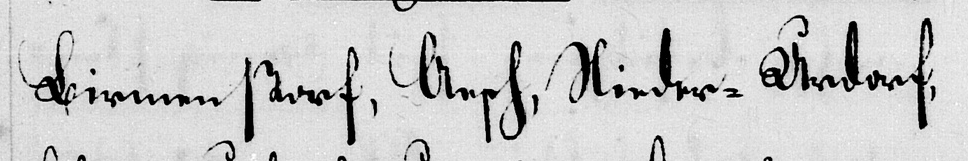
Birmensdorf, Aesch, Hinter-Urdorf,
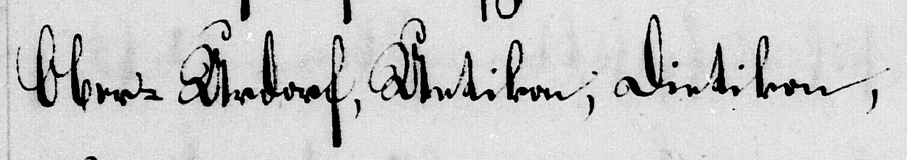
Ober-Urdorf, Uetikon, Dietikon,
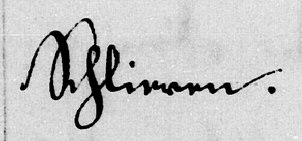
Schlieren.
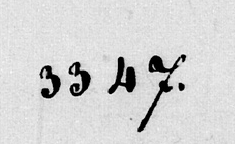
3347.
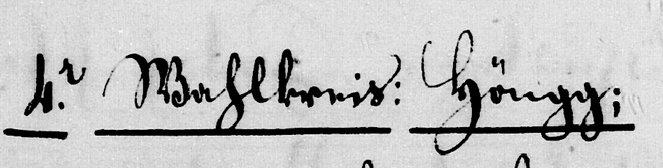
4.r Wahlkreis: Höngg;
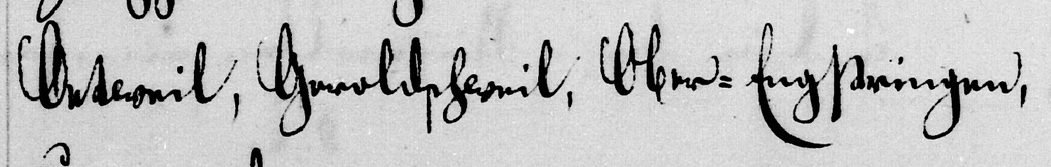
etweil, Geroldschweil, Ober-Engstringen,
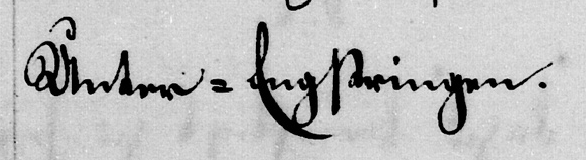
Unter-Engstringen.
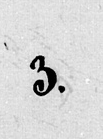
3.
